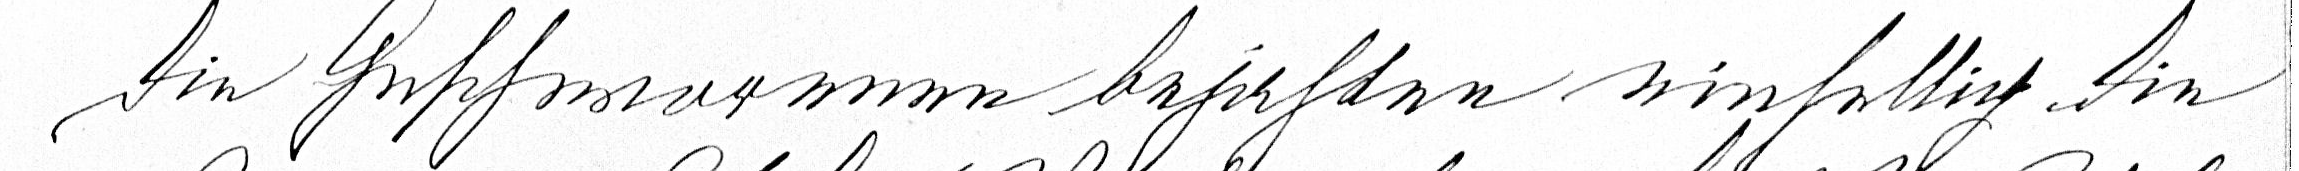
Die Geschworenen bejahten einhellig die
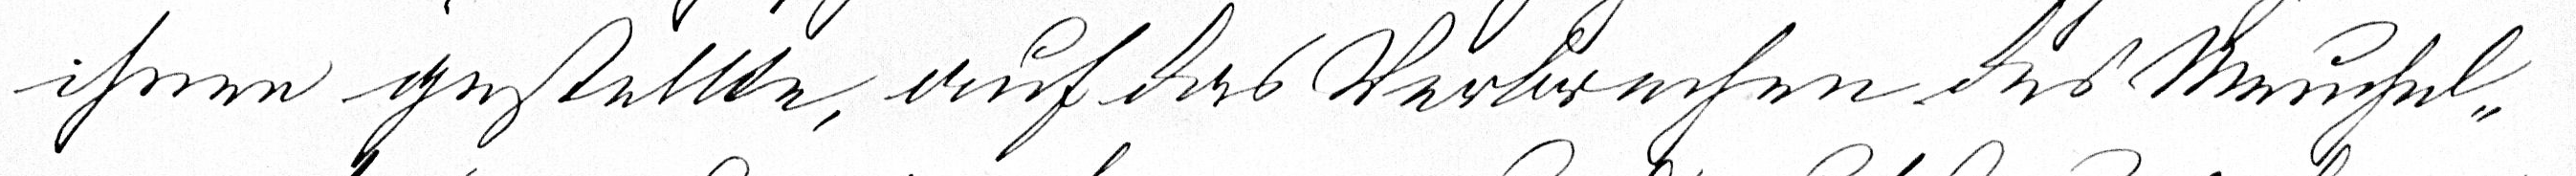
ihnen gestellte, auf das Verbrechen des Meuchel¬
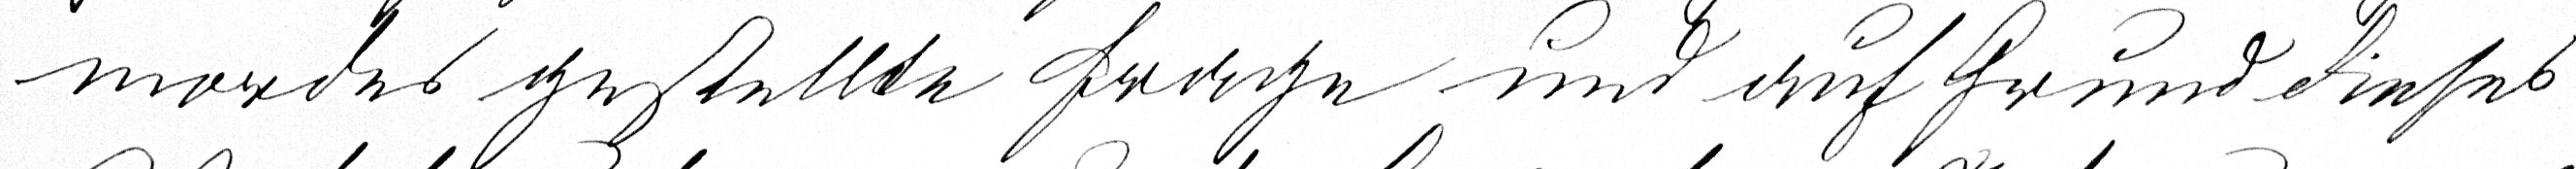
mordes gestellte Frage und auf Grund dieses
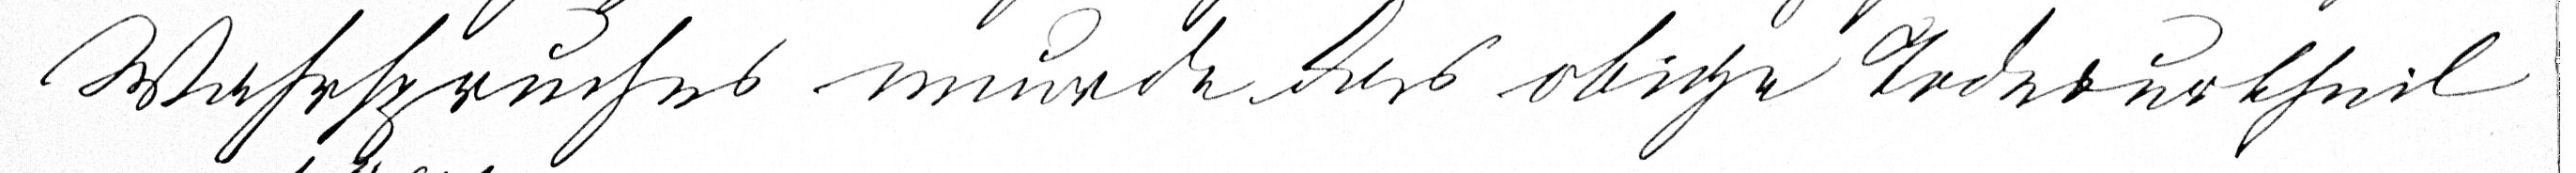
Wahrspruches wurde das obige Todesurtheil
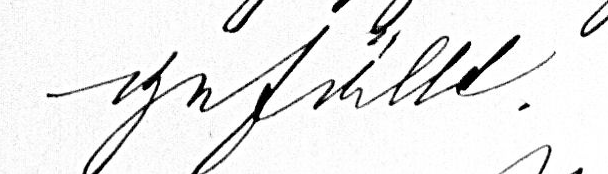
gefällt.
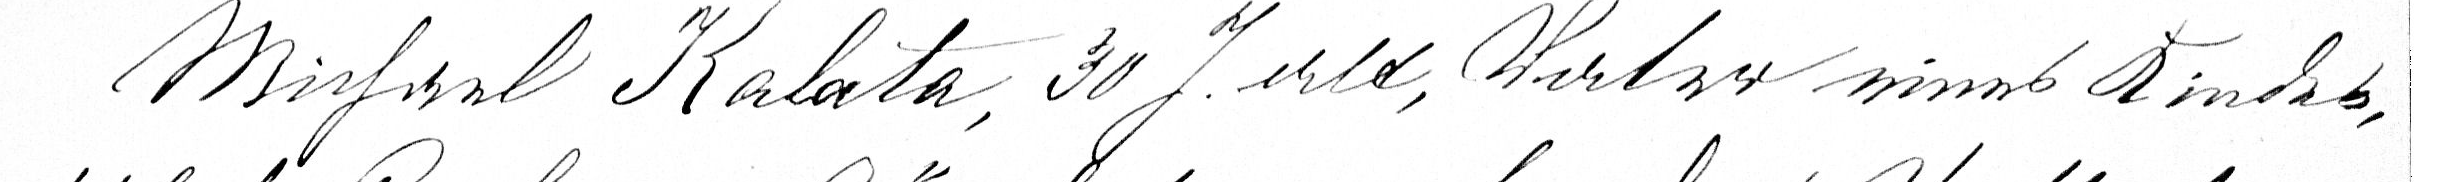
Michael Kalata, 30 J. alt, Vater eines Kindes,
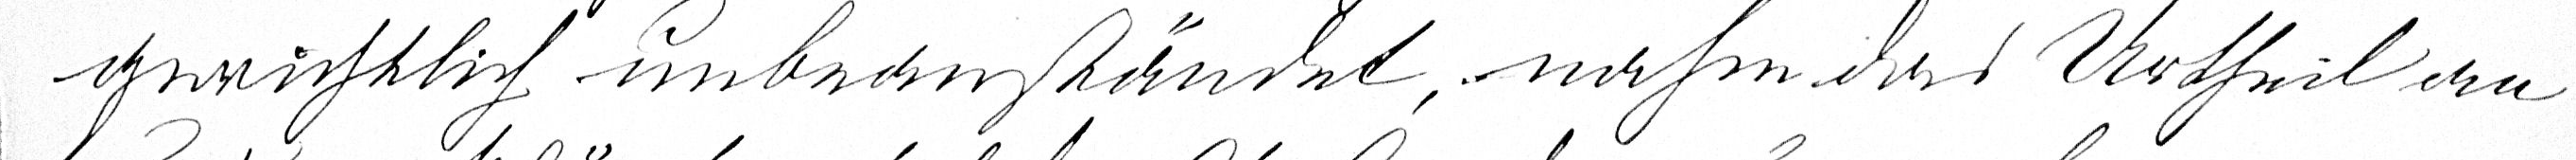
gerichtlich unbeanständet, nahm das Urtheil an
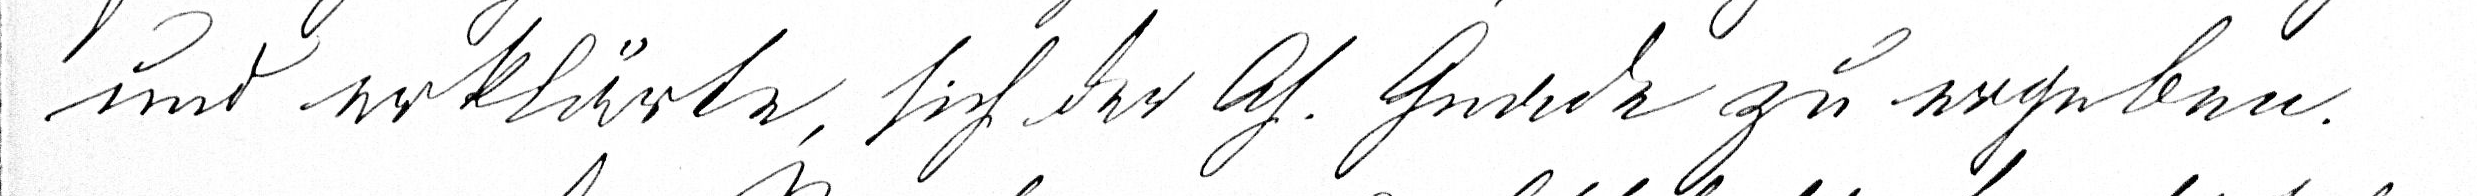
und erklärte, sich der Ah. Gnade zu ergeben.
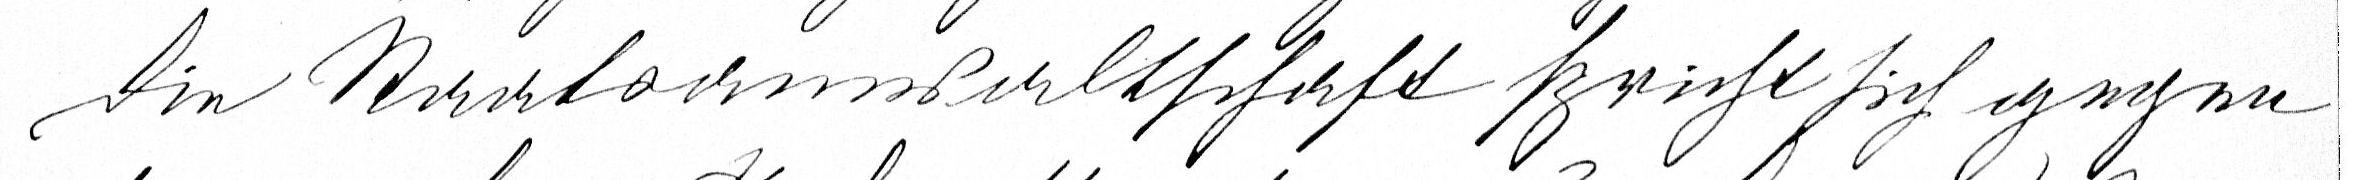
Die Staatsxxsaltschaft spricht sich gegen
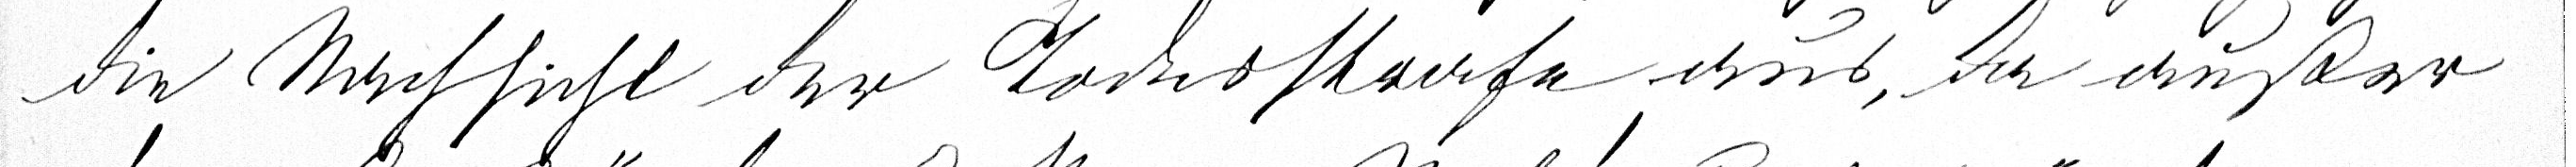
die Nachsicht der Todesstrafe aus, da außer
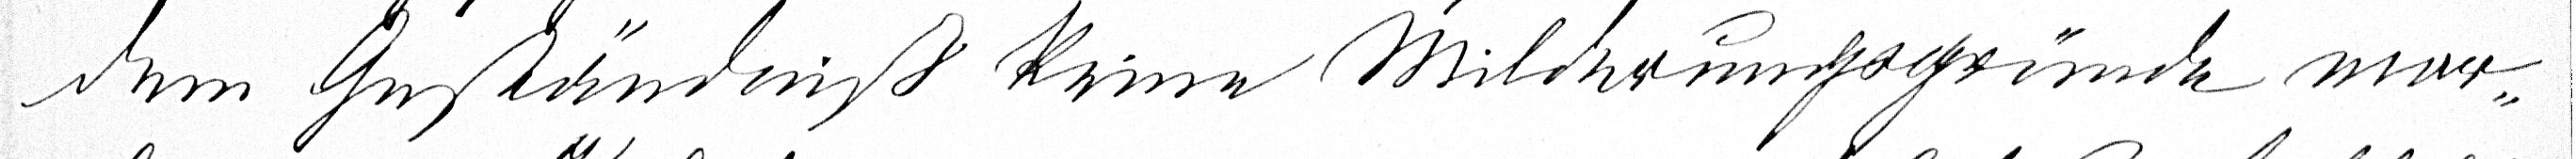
dem Geständniß keine Milderungsgründe vor¬
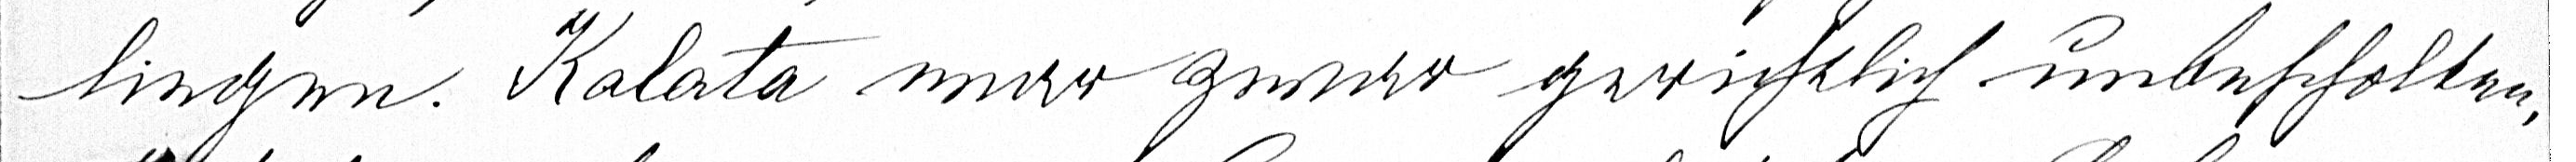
liegen. Kalata war zwar gerichtlich unbescholten,
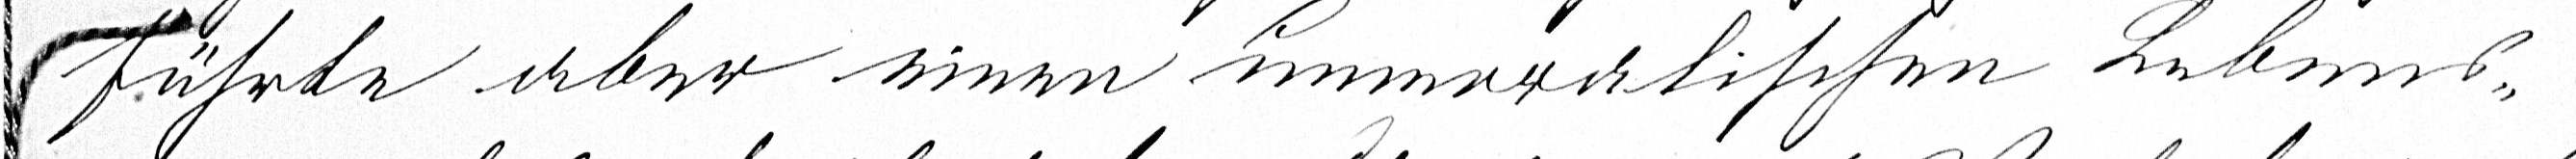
führte aber einen unmoralischen Lebens¬
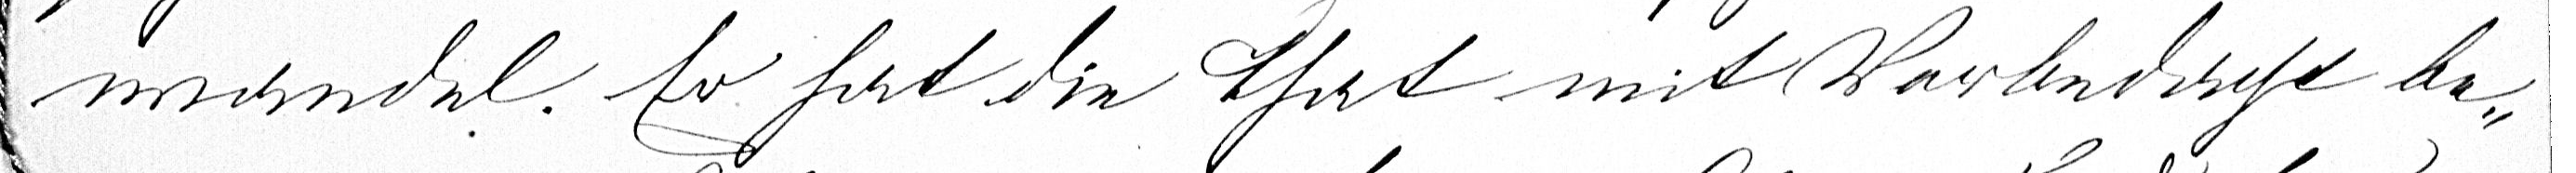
mandel. Er hat die That mit Verbedacht be¬
